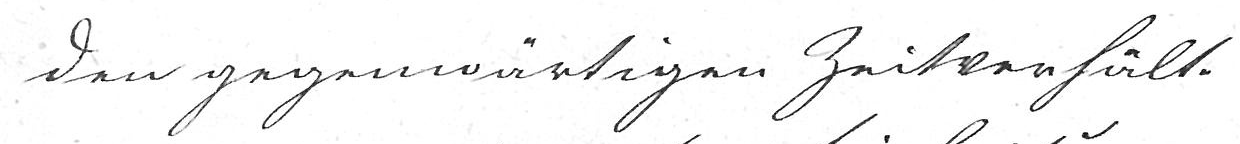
den gegenwärtigen Zeitverhält-
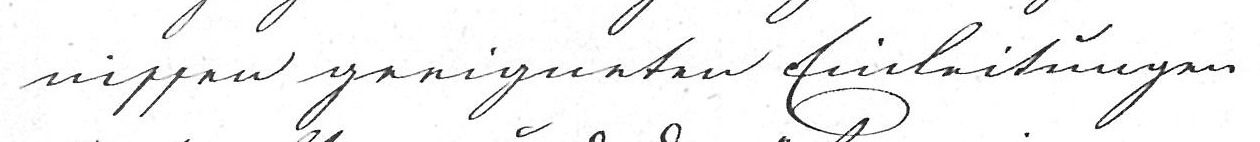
nisten geeigneten Einleitungen
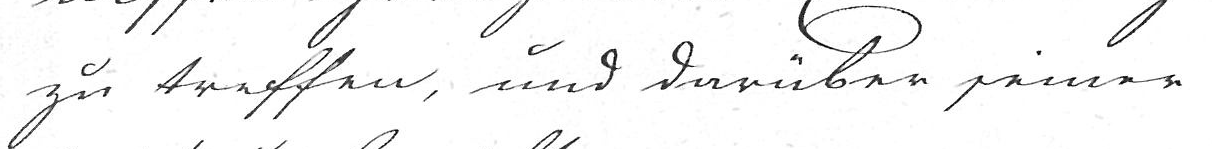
zu treffen, und darüber seiner
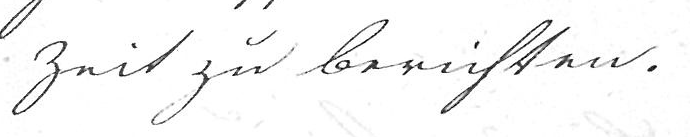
Zeit zu berichten.
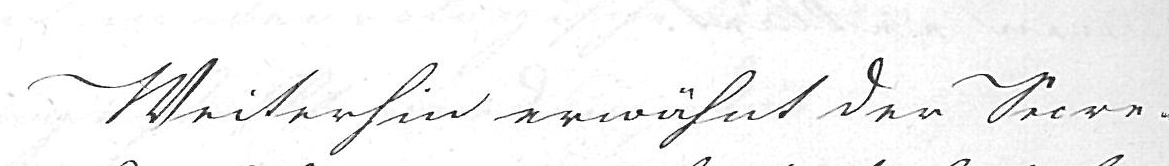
Weiterhin erwähnt der Secre-
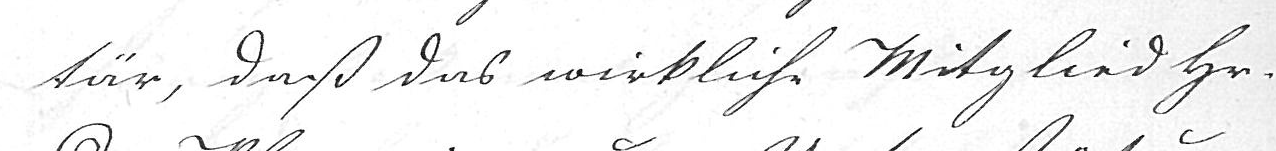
tär, daß das wirkliche Mitglied Hr.
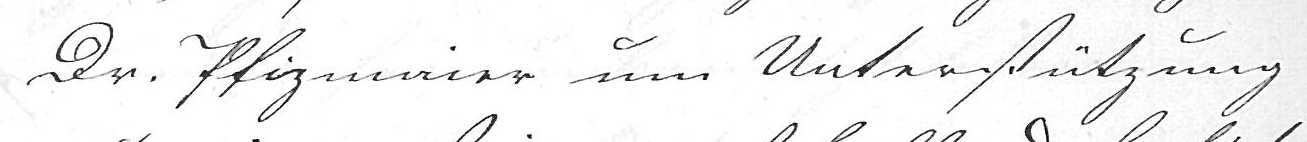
Dr. Pfizmaier um Unterstützung
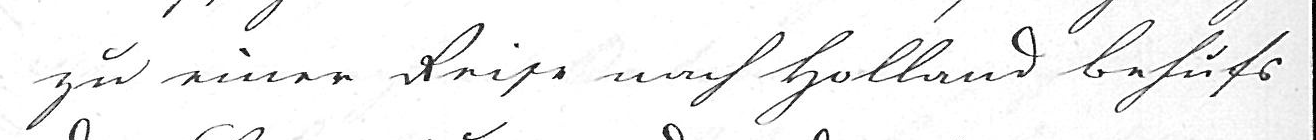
zu einer Reise nach Hollend behufs
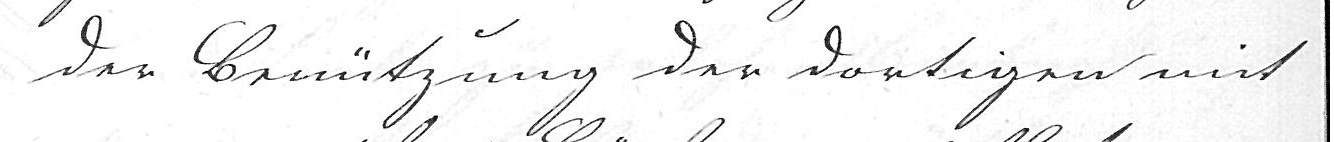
der Benützung der dortigen mit
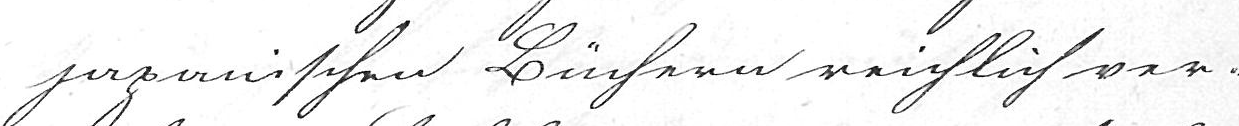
japanischen Büchern reichlich ver-
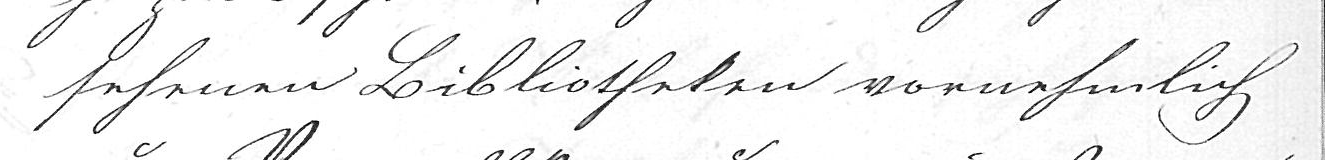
sehenen Bibliotheken vornehmlich
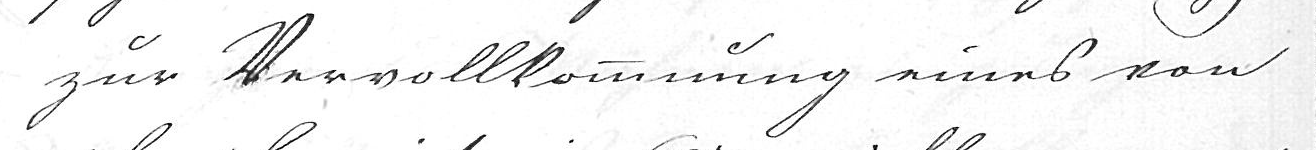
zur Vervollkommnung eines von
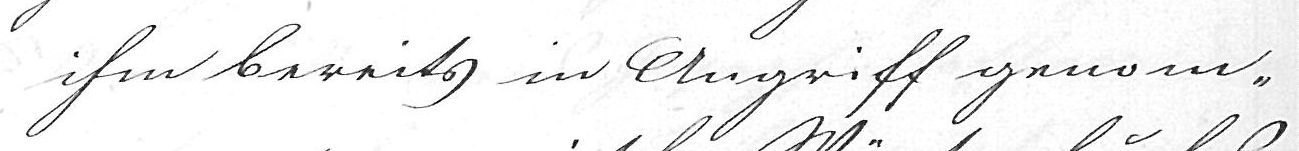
ihm bereits in Angriff genom-
